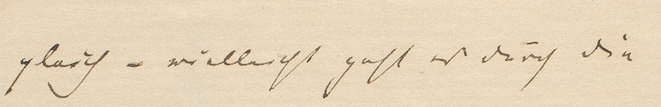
gleich – vielleicht geht es durch die
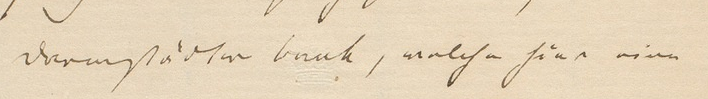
Darmstädter Bank, welche hier eine
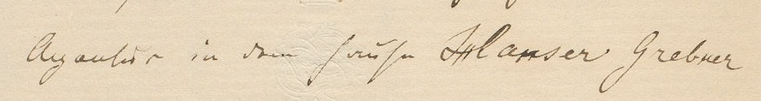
Agentur in dem Hause Hanser Grebner
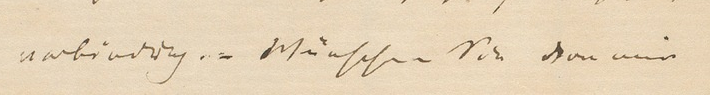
verbindung. – Wünschen Sie von mir
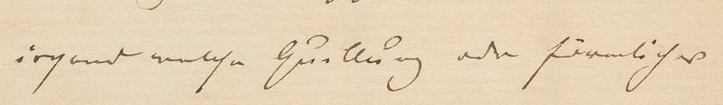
irgend welche Quittung oder förmliches
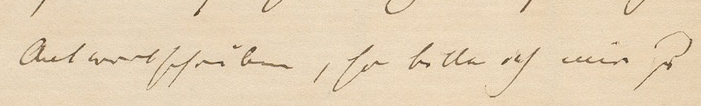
Antwortschreiben, so bitte ich mir zu
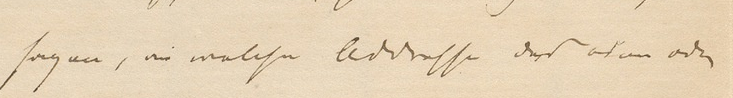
sagen, an welche Addresse das eine oder
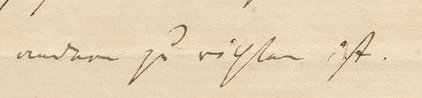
andere zu richten ist.
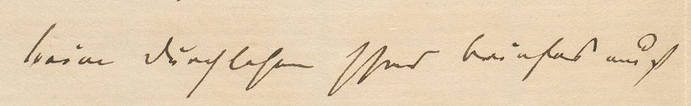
Beim Durchlesen Ihres Briefes muß
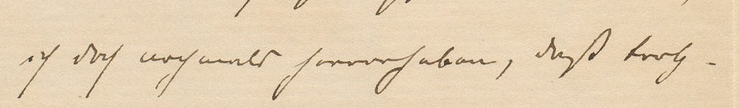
ich doch nochmals hervorheben, daß trotz-
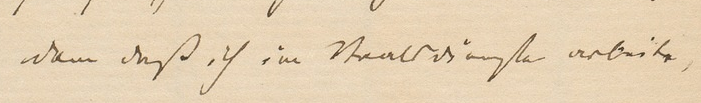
dem daß ich im Staatsdienste arbeite,
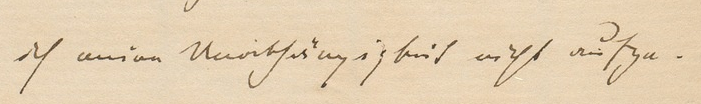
ich meine Unabhängigkeit nicht aufzu-
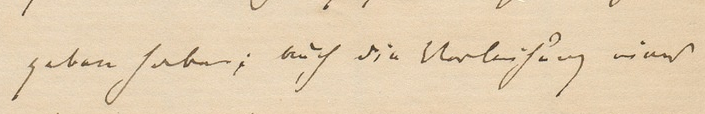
geben habe; auch die Verleihung eines
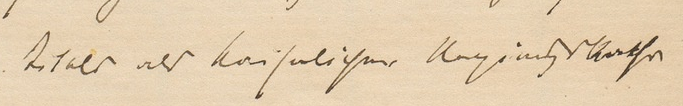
Titels als kaiserlicher RegierungsRaths
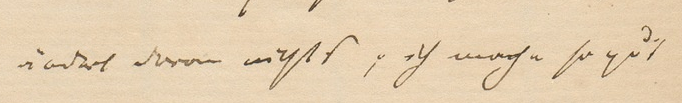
ändert daran nichts; ich mache so gut
